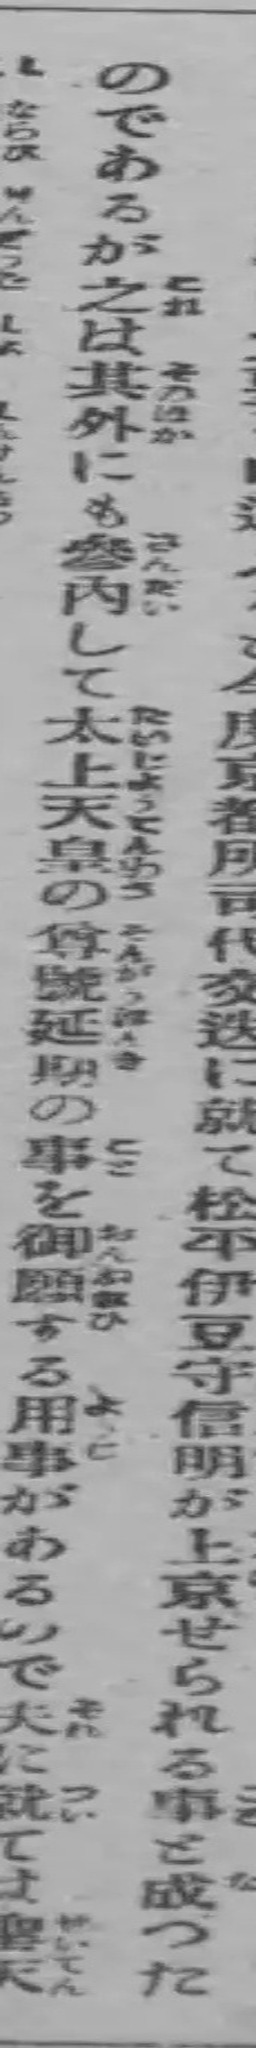のであるが之は其外にも参内して太上天皇の尊号延期の事を御願する用事があるので夫に就ては聖天
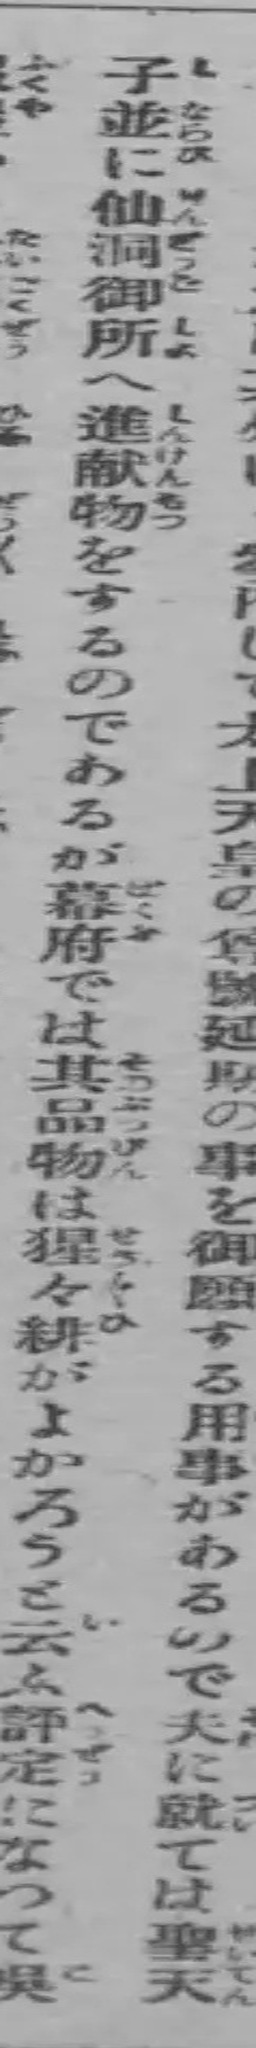子並に仙洞御所へ進献物をするのであるが幕府では其品物は猩々緋がよかろうと云ふ評定になつて呉
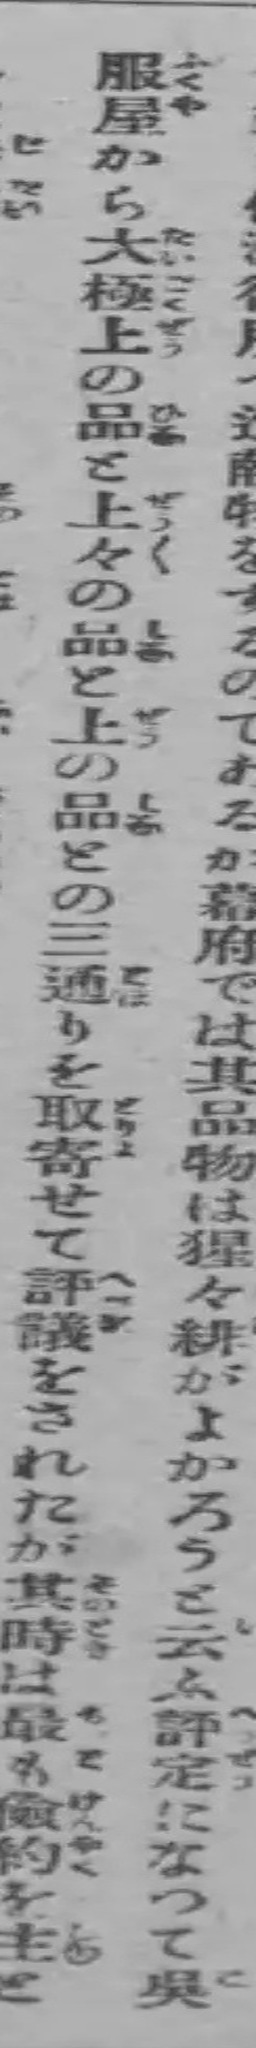服屋から大極上の品と上々の品と上の品との三通りを取寄せて評議をされたが其時は最も倹約を主と
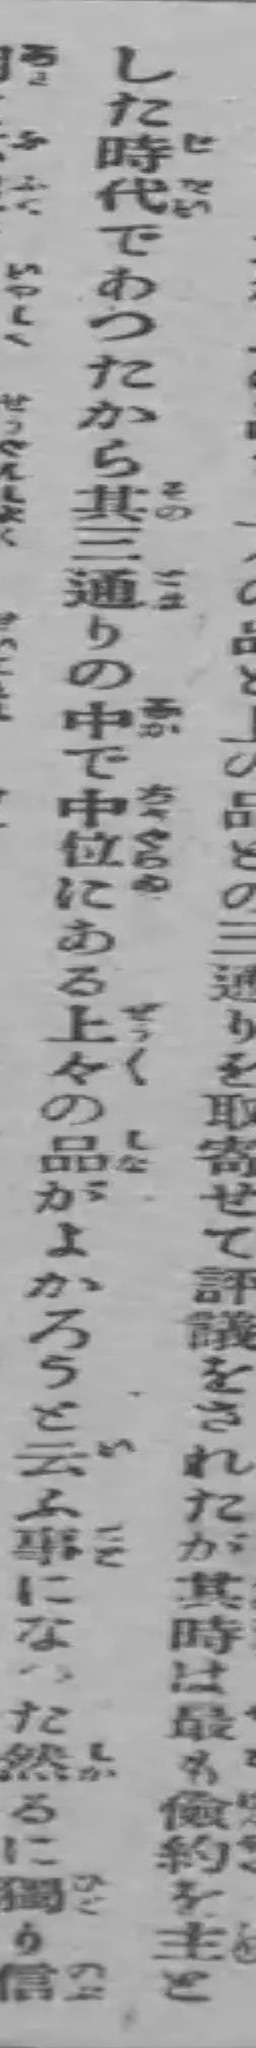した時代であつたから其三通りの中で中位にある上々の品がよかろうと云ふ事になつた然るに独り信
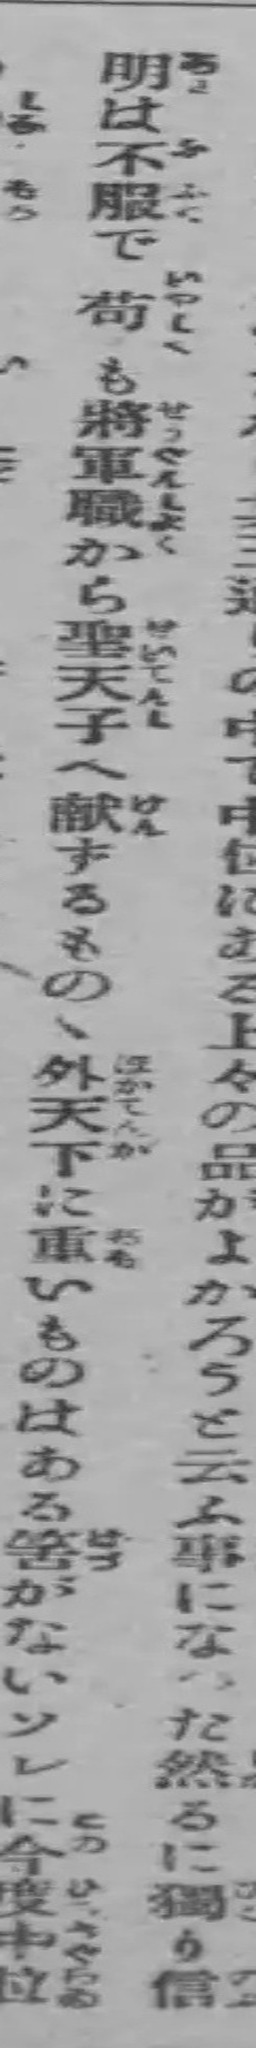明は不服で苟も将軍職から聖天子へ献ずるものゝ外天下に重いものはある筈がないソレに今度中位
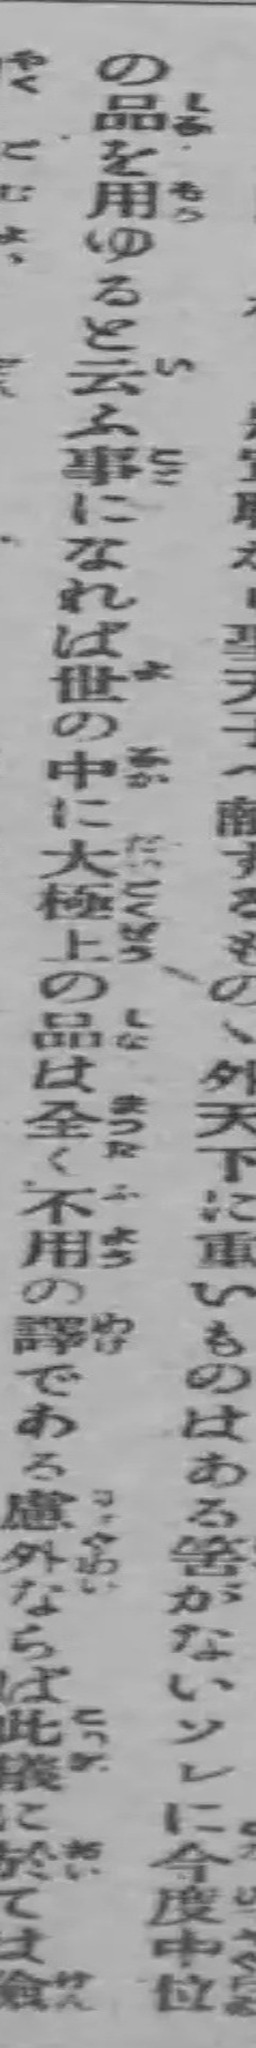の品を用ゆると云ふ事になれば世の中に大極上の品は全く不用の訳である慮外ならば此儀に於ては倹
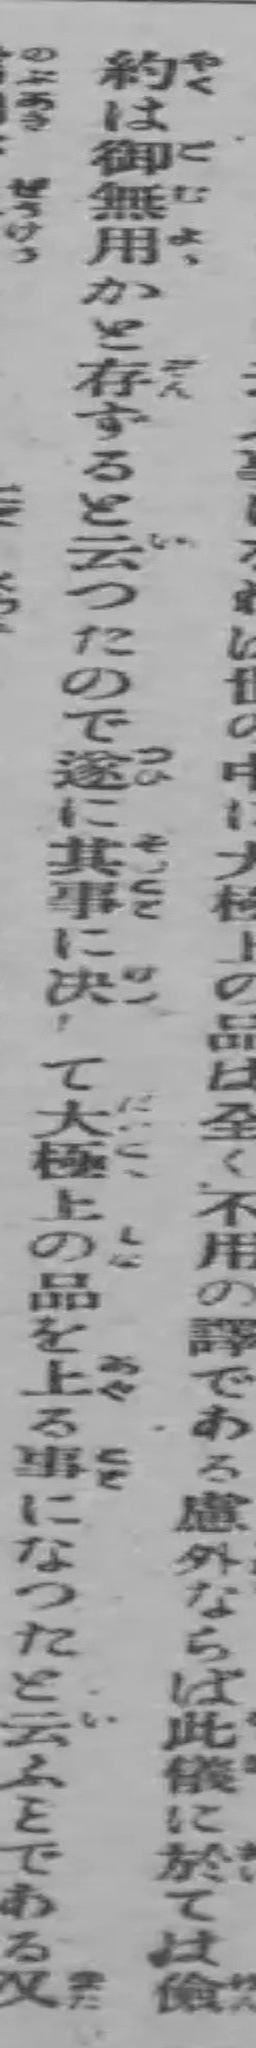約は御無用かと存ずると云つたので遂に其事に決して大極上の品を上る事になつたと云ふことであるまた又
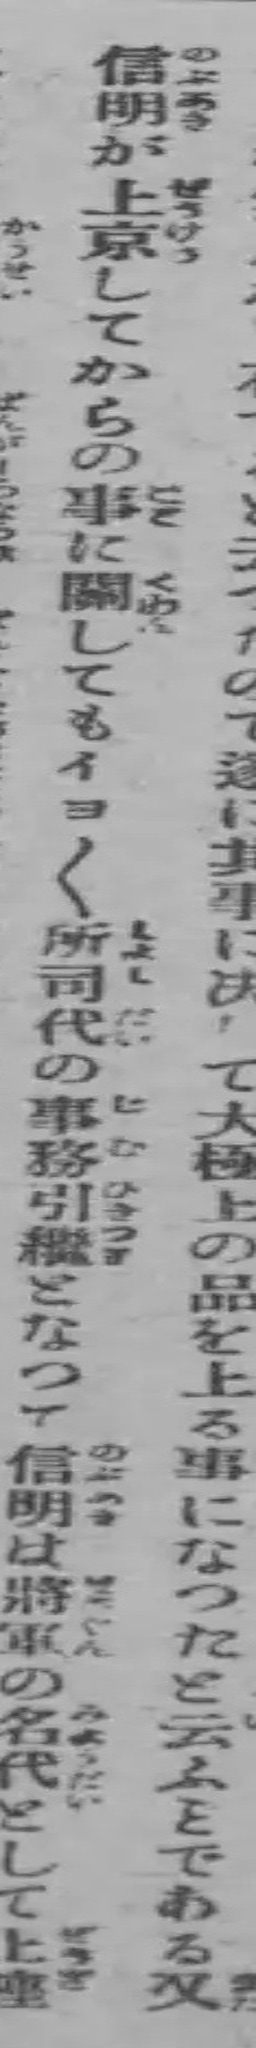信明が上京してからの事に関してもイヨ〳〵所司代の事務引継となつて信明は将軍の名代として上座
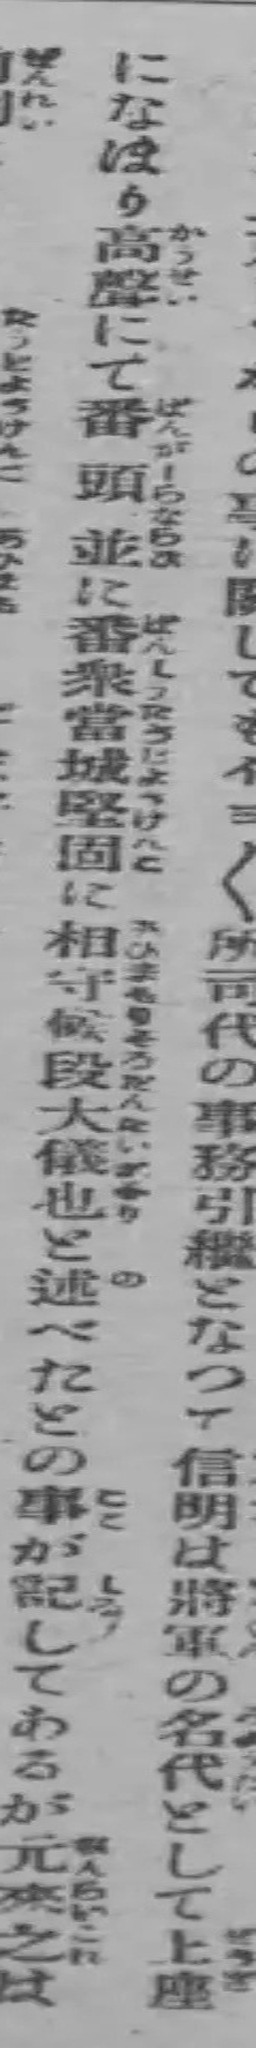になほり声高にて番頭並に番衆当城堅固に相守候段大儀也と述べたとの事が記してあるが元来之は
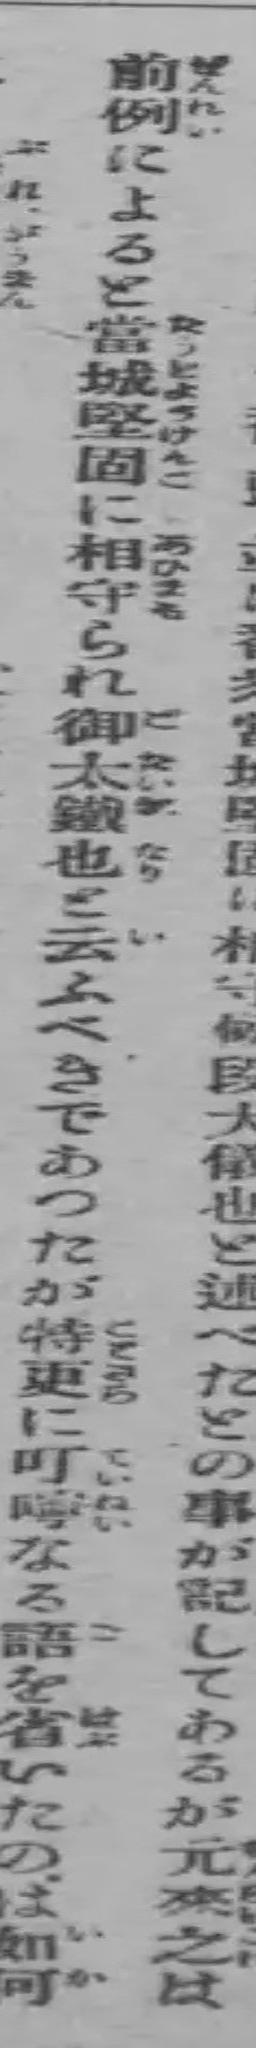前例によると当城堅固に相守られ御太鐵也と云ふべきであつたが特更に叮嚀なる語を省いたのは如何
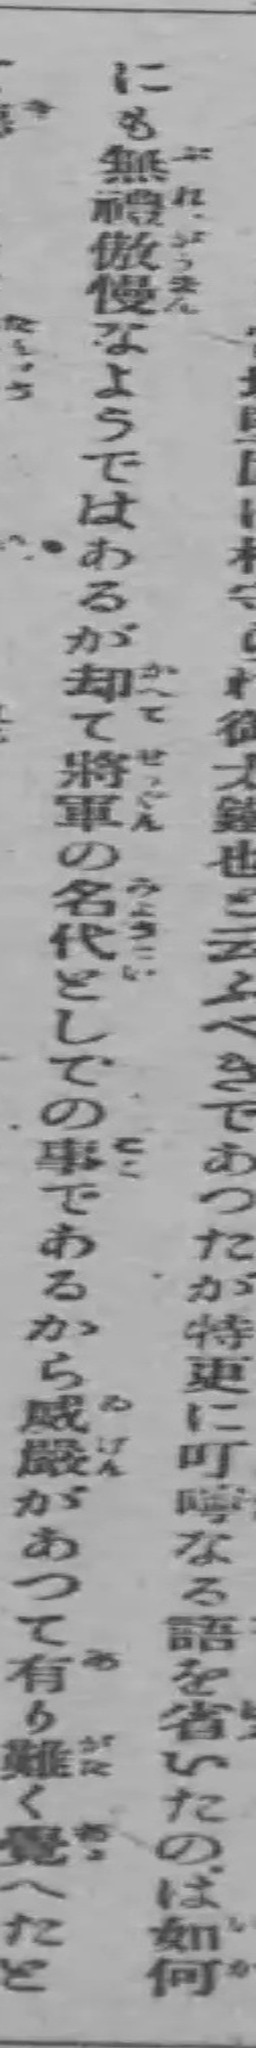にも無礼傲慢なようではあるが却て将軍の名代としての事であるから威厳があつて有り難く覚へたと
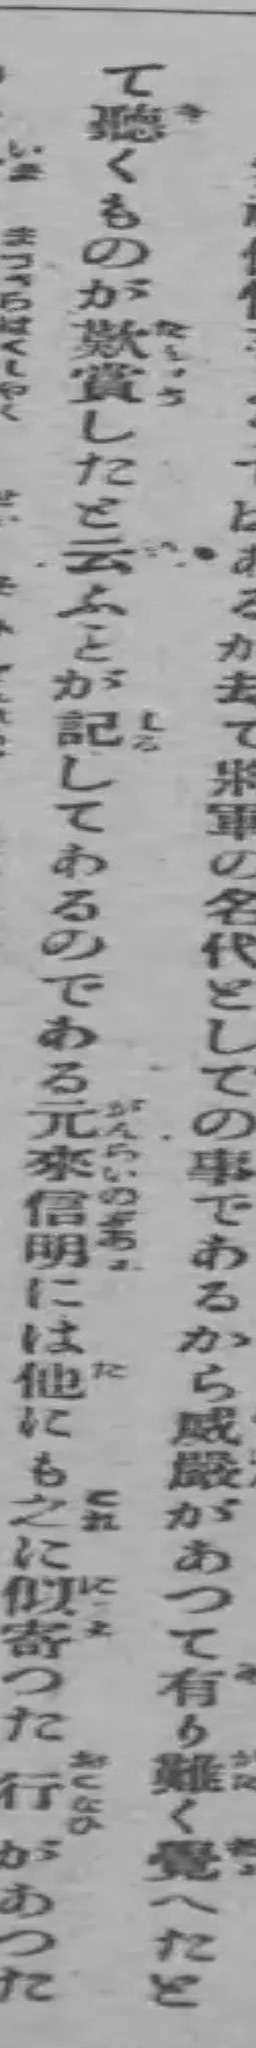て聴くものが歎賞したと云ふことが記してあるのである元来信明には他にも之に似寄つた行があつた
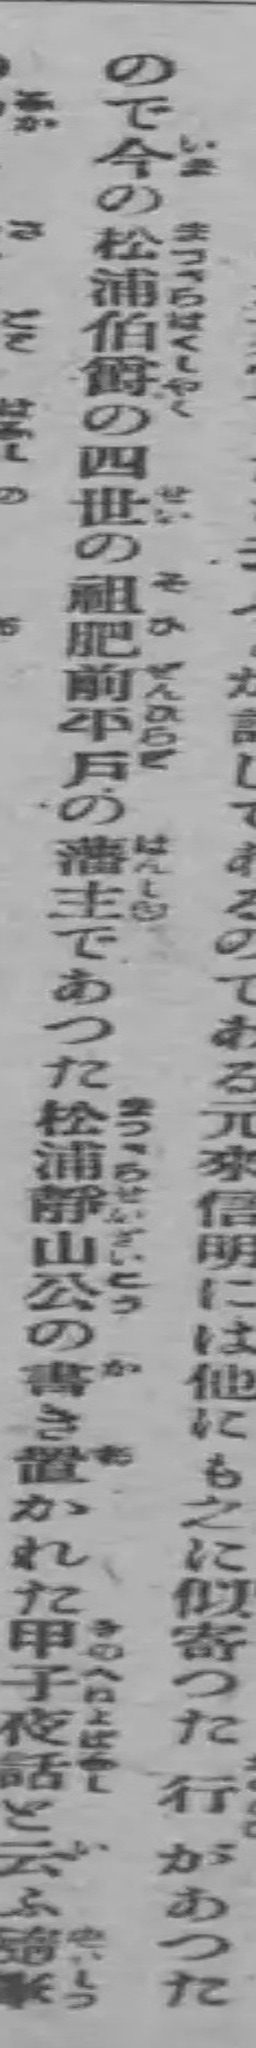ので今の松浦伯爵の四世の祖肥前平戸の藩主であつた松浦静山公の書き置かれた甲子夜話と云ふ随筆
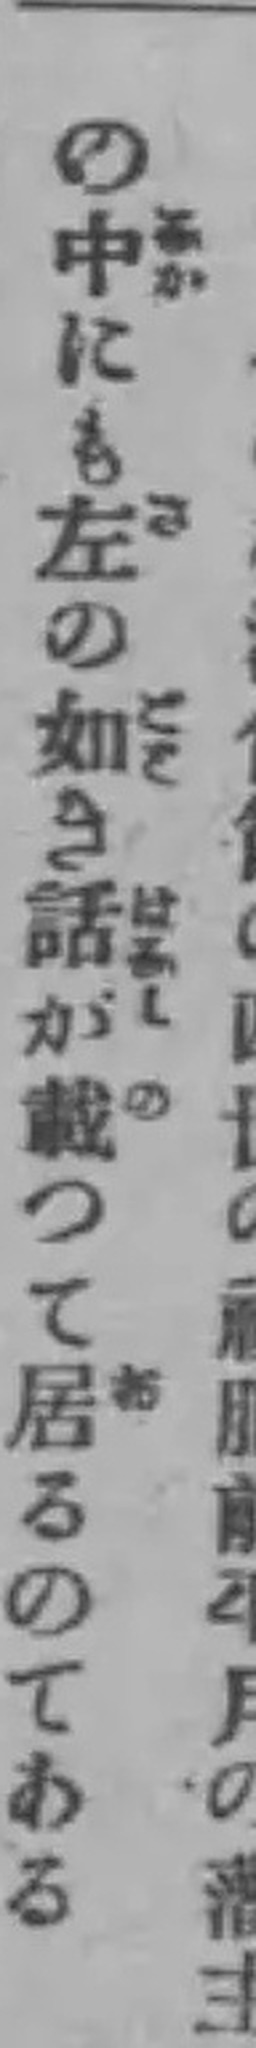の中にも左の如き話が載つて居るのである
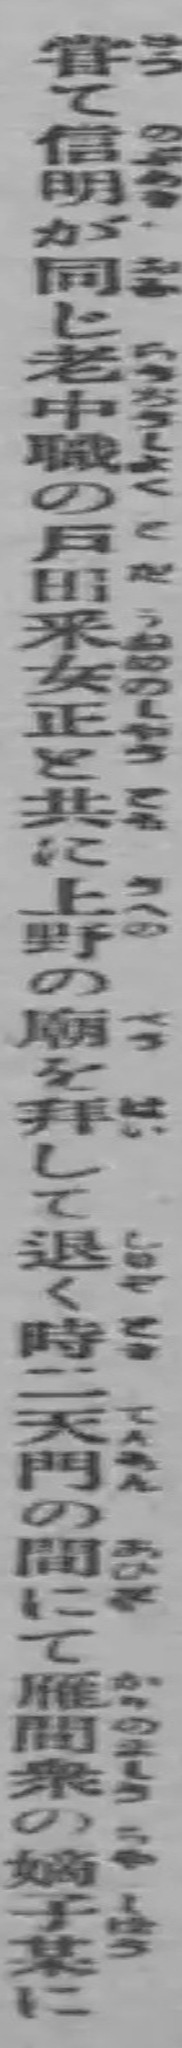嘗て信明が同じ老中職の戸田采女正と共に上野の廟を拝して退く時二天門の間にて雁間衆の嫡子某に
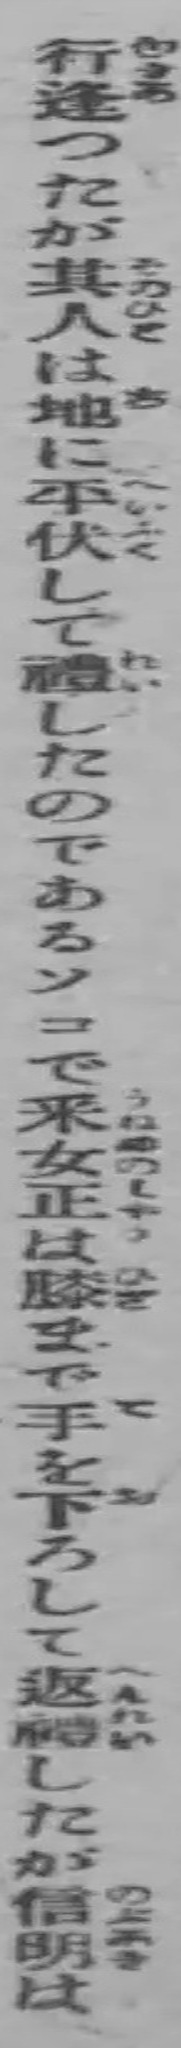行逢つたが其人は地に平伏して礼したのであるソコで采女正は膝まで手を下ろして返礼したが信明は
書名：豊橋市史談
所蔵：国立国会図書館 National Diet Library, JAPAN
